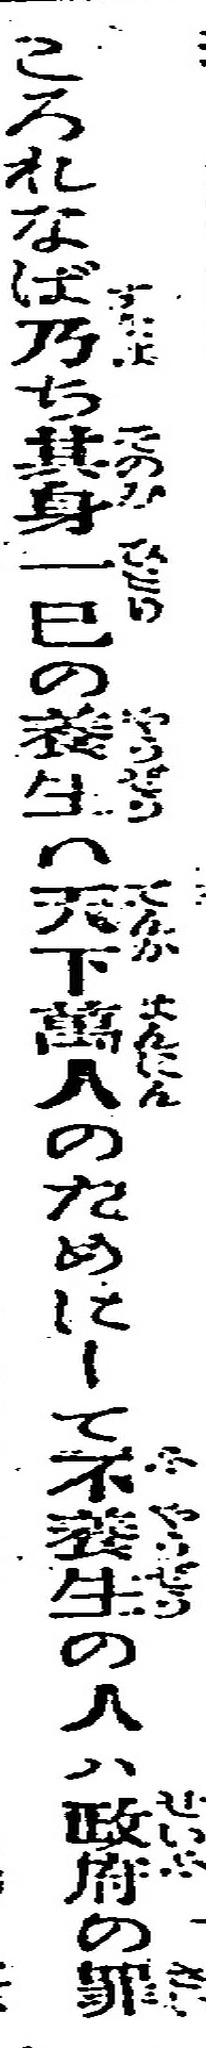ころれなば乃ち其身一巳の養生は天下萬人のためにして不養生の人は政府の罪
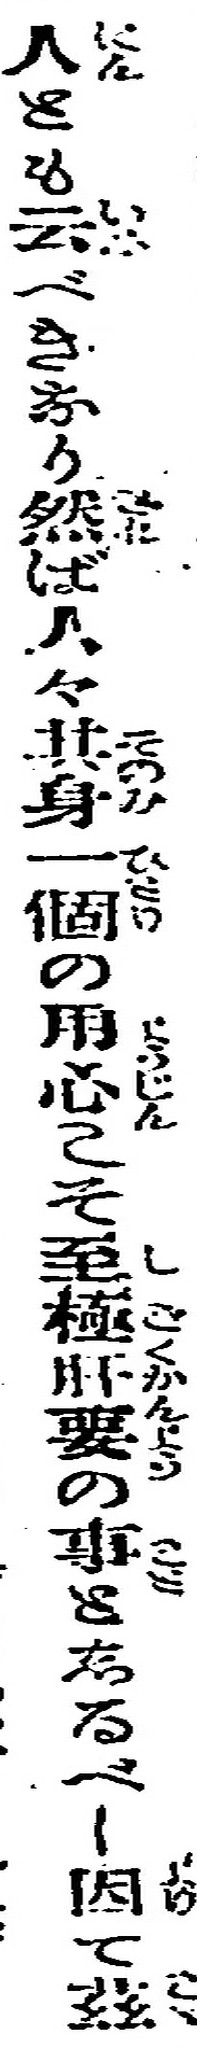人とも云べきなり然ば人々其身一個の用心こそ至極肝要の事としるべし因て茲
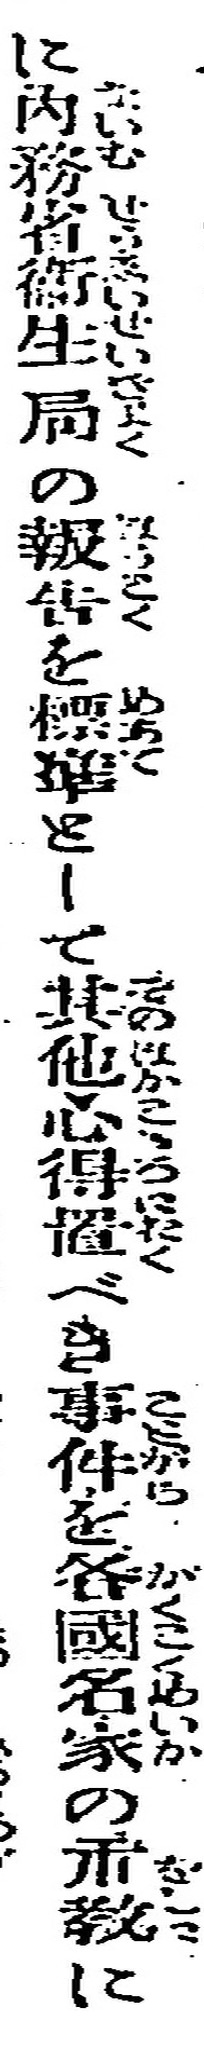に内務省衛生局の報告を標準として其他心得置べき事件を各國名家の示教に
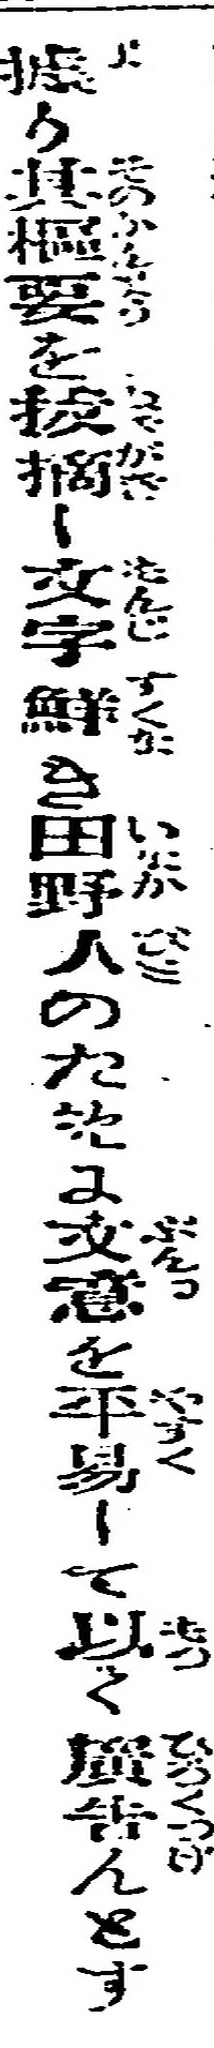拠り其樞要を抜摘し文字鮮き田野人のために文意を平易して以て廣告んとす
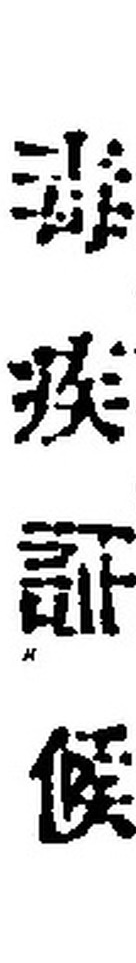毒疾証候
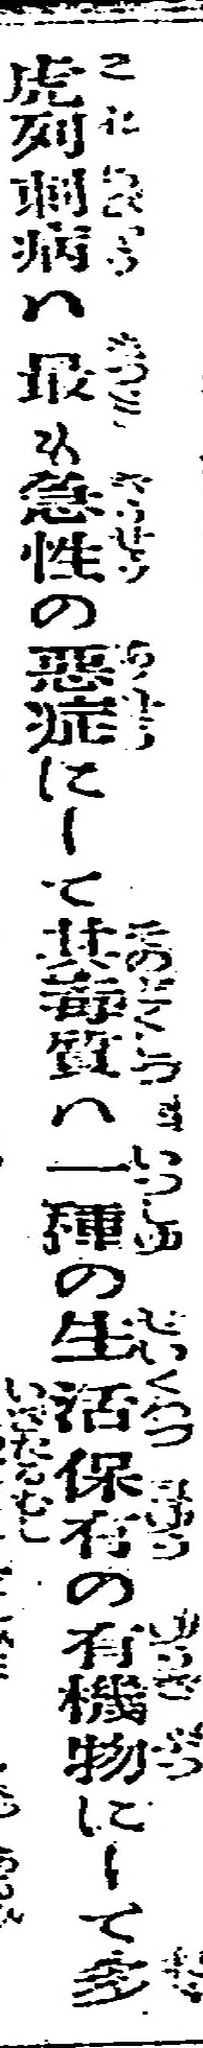虎列刺病は最も急性の悪症にして其毒質は一種の生活保有の有機物にして多
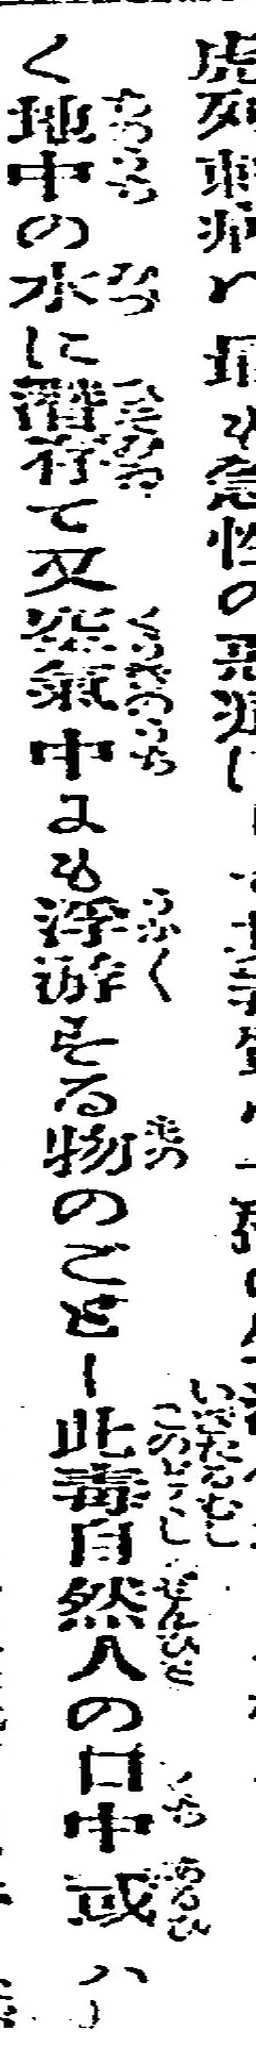く地中の水に潜存て又空氣中にも浮游する物のごとし此毒自然人の口中或は
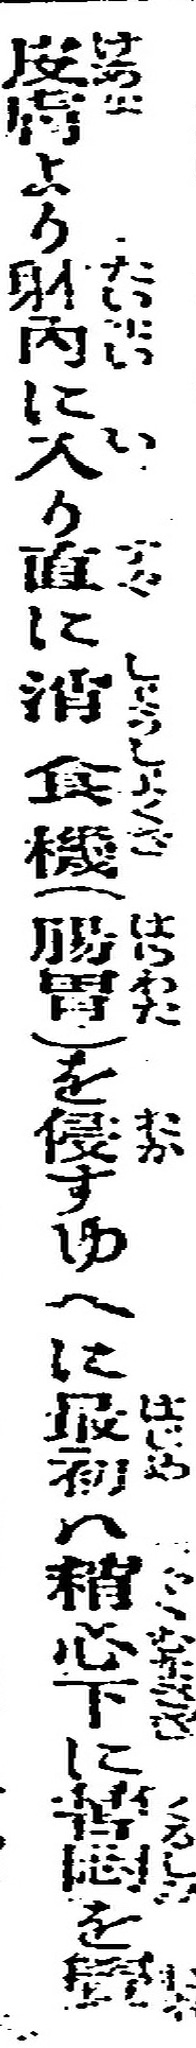皮膚より躰内に入り直に消食機[膓胃]を侵すゆへに最初は稍心下に苦悶を覚
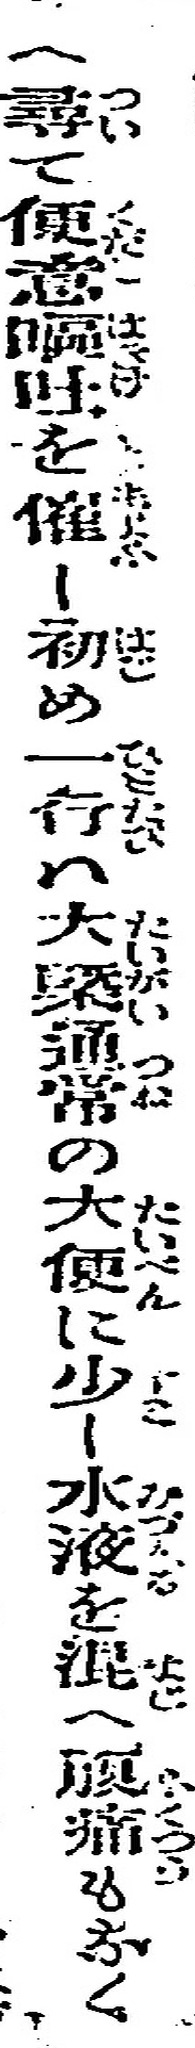へ尋て便意嘔吐を催し初め一行は大概通常の大便に少し水液を混へ腹痛もなく
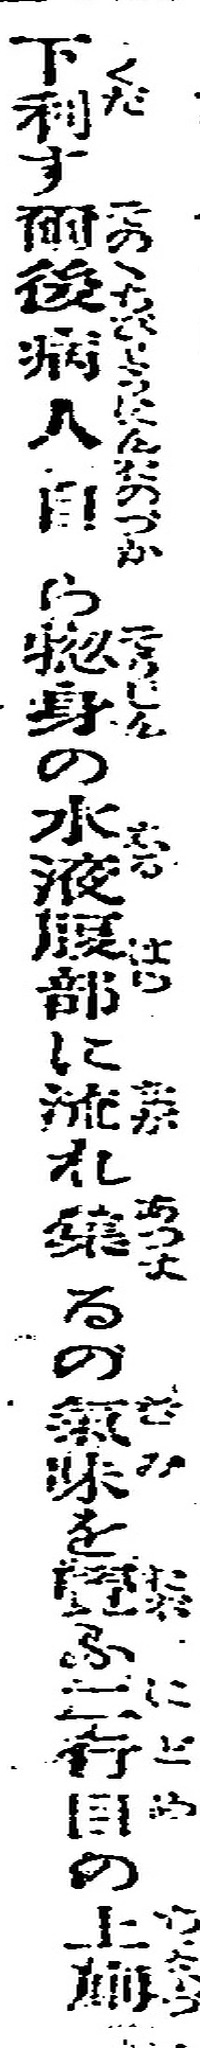下利す爾後病人自ら惣身の水液腹部に流れ集るの氣味を覚ふ二行目の上厠
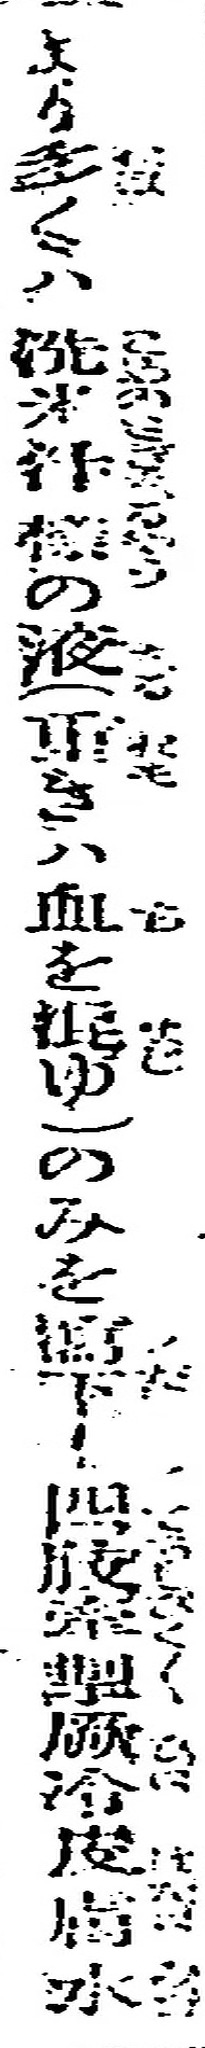より多くは洗米汁様の液[重きは血を混ゆ]のみを瀉したし四肢製厥冷皮膚水
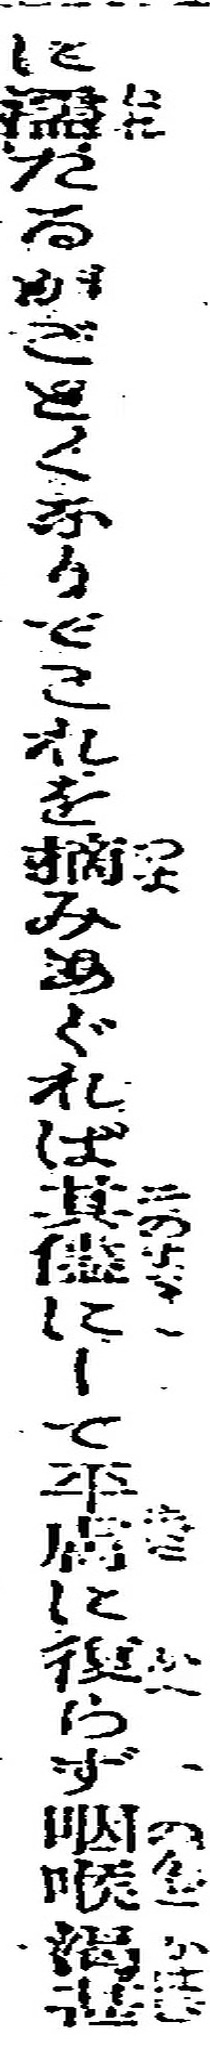に濡たるがごとくなりてこれを摘みあぐれば其儘にして平膚に復らず咽喉渇甚
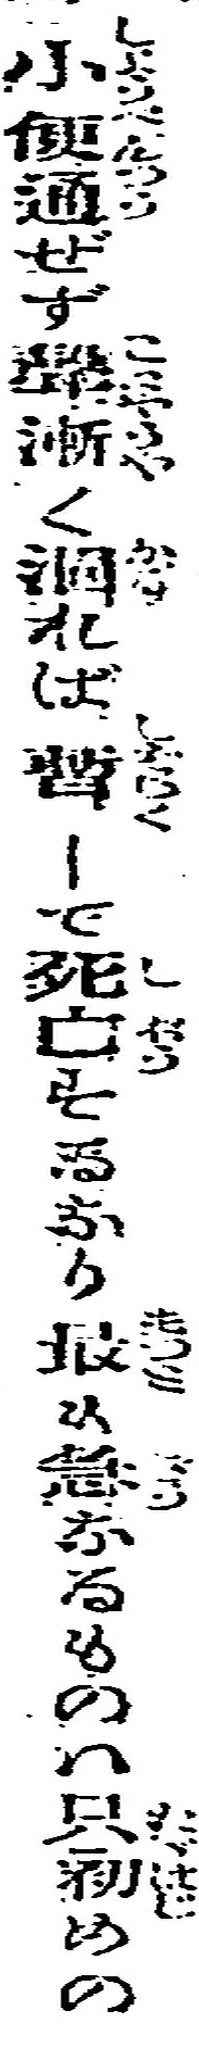小便通ぜず聲漸く涸れば暫して死亡するなり最も急なるものは只初めの
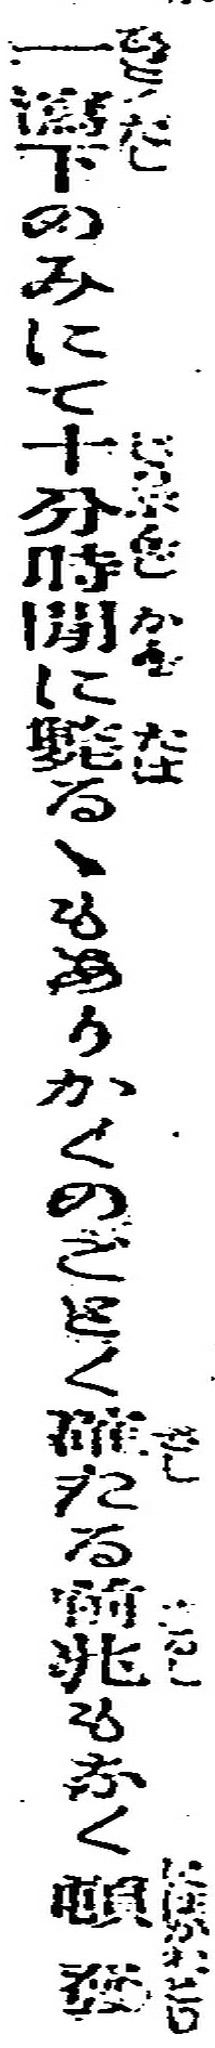一瀉下のみにて十分時間に斃るゝもなりかくのごとく確たる前兆もなく頓發
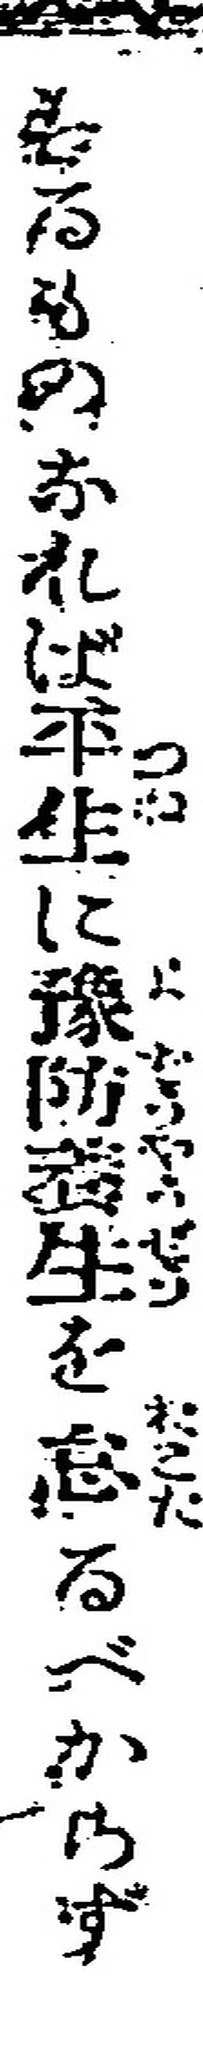するものなれば平生に豫防養生を怠るべからず
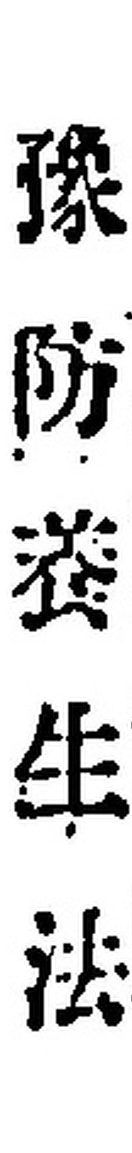豫防養生法
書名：虎列剌病予防養生法訳解
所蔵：国立国会図書館 National Diet Library, JAPAN
